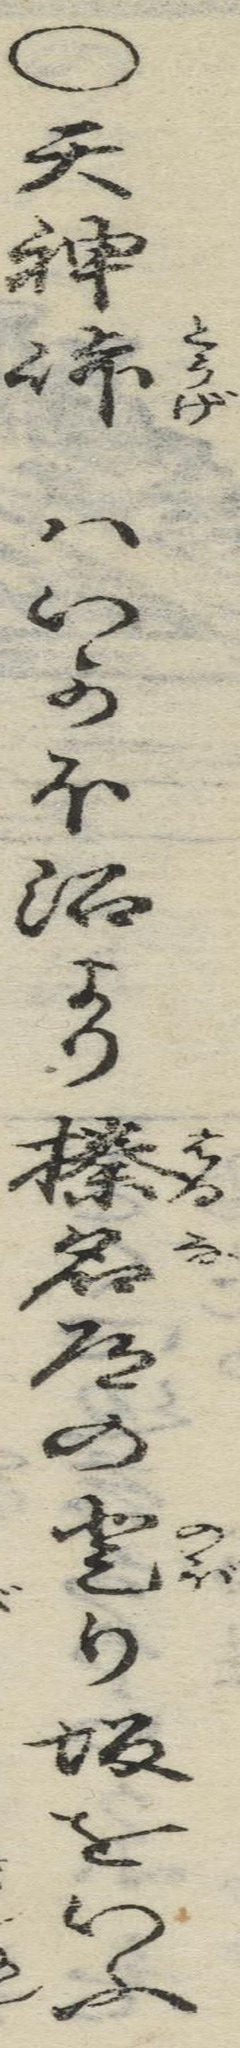○天神峠はいかほ不治より榛名路の登り坂をいふ
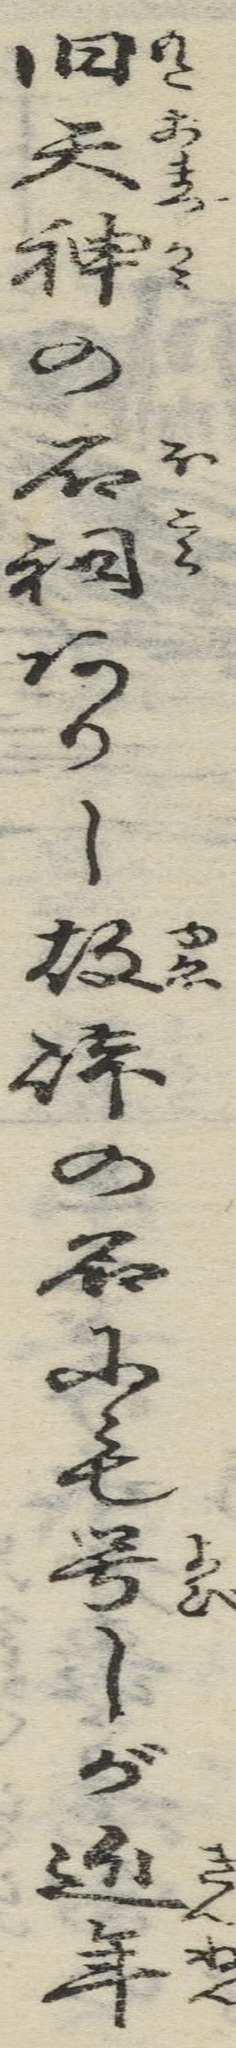旧天神の石祠なりし故峠の名にも号しが近年
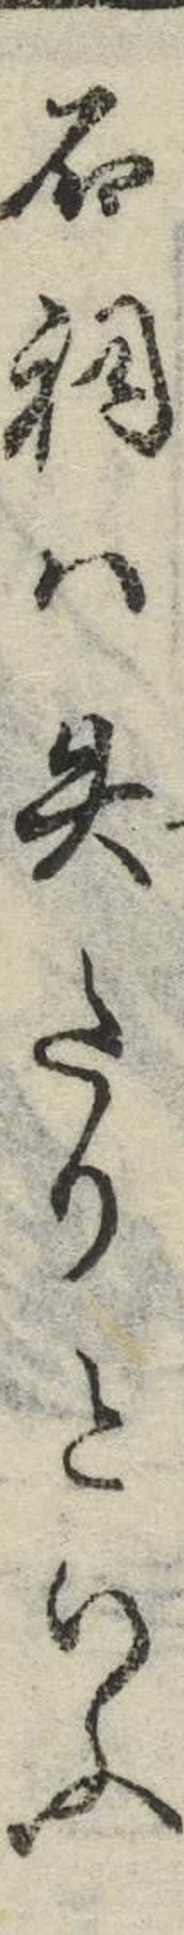石祠は失たりといふ
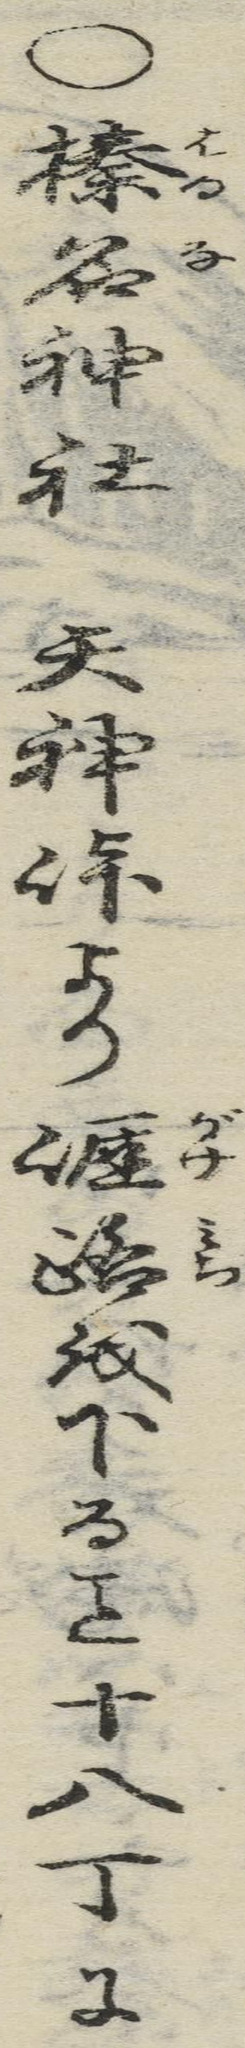○榛名神社天神峠より崕路を下ること十八丁に
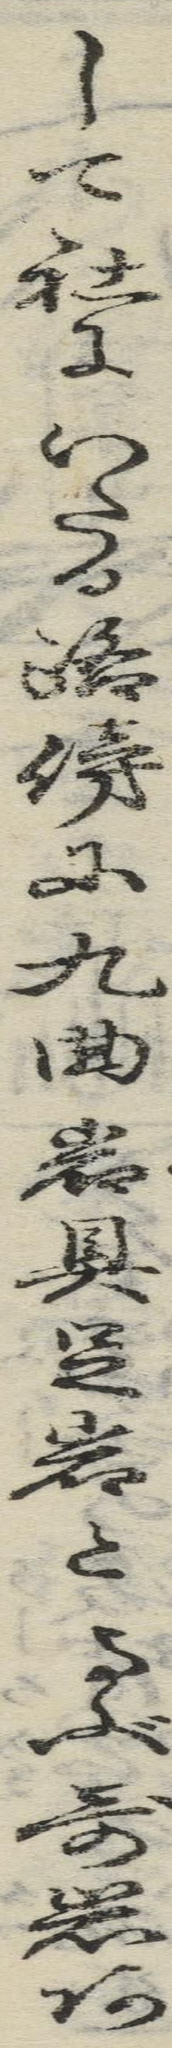して社にいたる路傍に九曲岩具足岩とよぶ奇岩あ
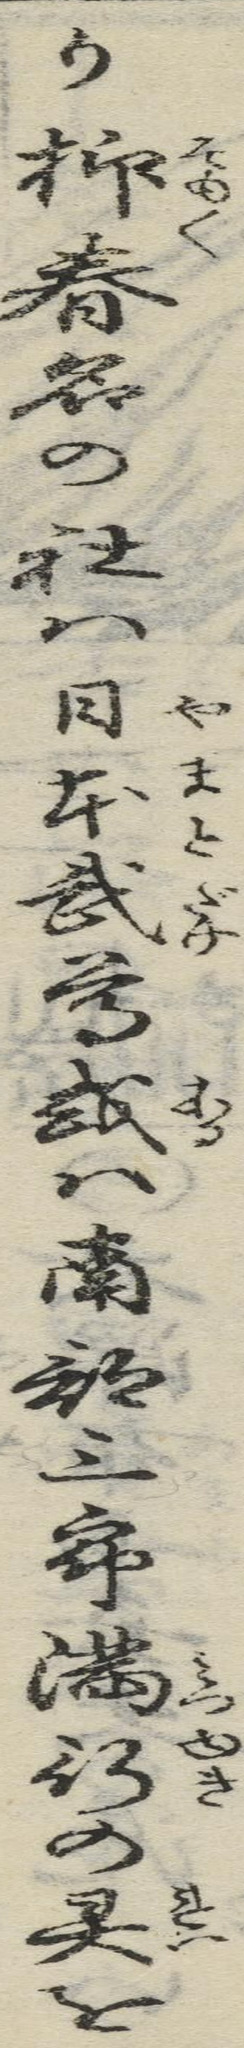り抑春名の社は日本武尊或は南部三郎満行の異を
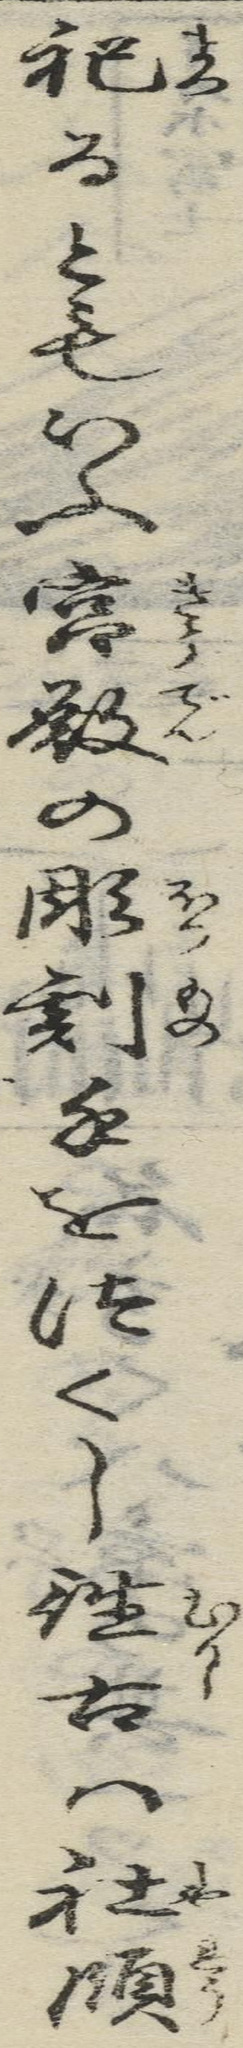祀るともいふ宮殿の彫刻手をつくし往古は社領
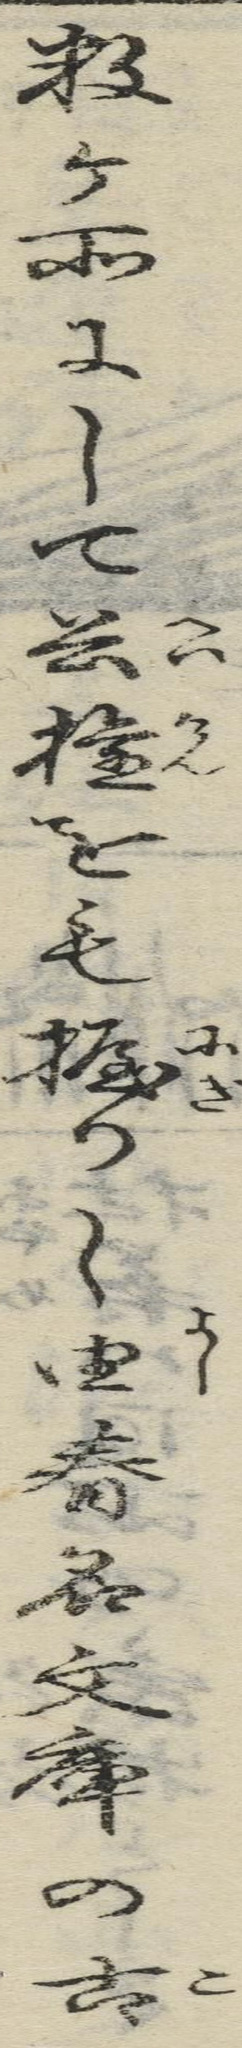数ヶ所にして兵権をも握りし由春名文庫の古
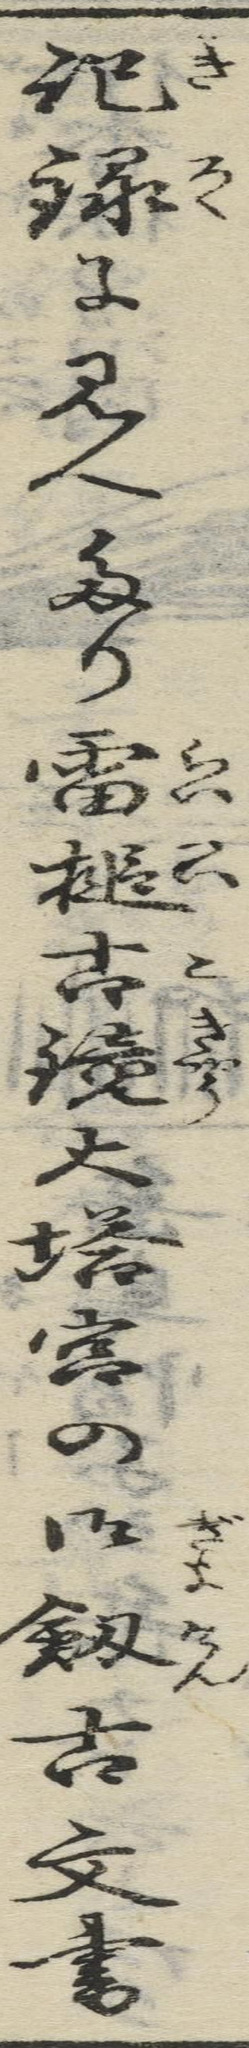記録に見へたり雷槌古鏡大塔宮の御劔古文書
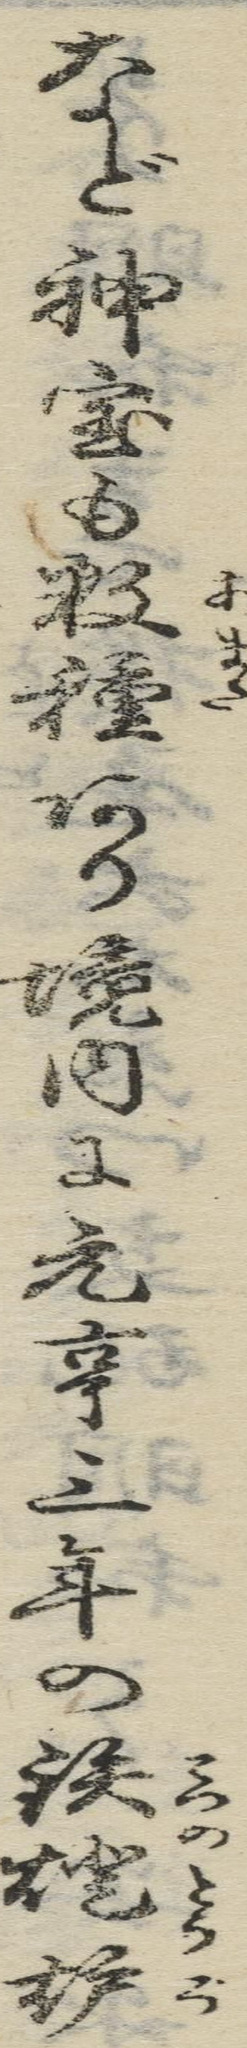まど神宝も数種あり境内に元亨三年の鉄燈炉
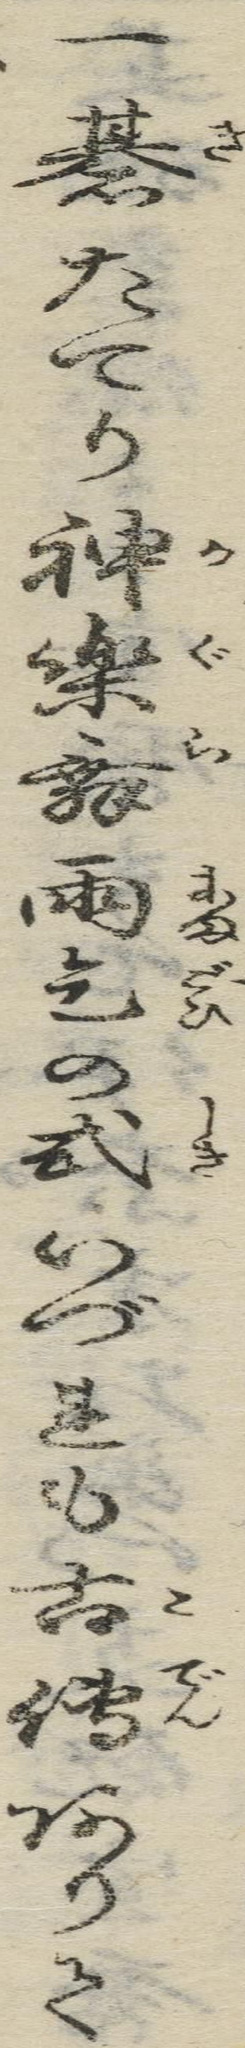一碁たてり神楽舞雨乞の式いづれの古傳ありて
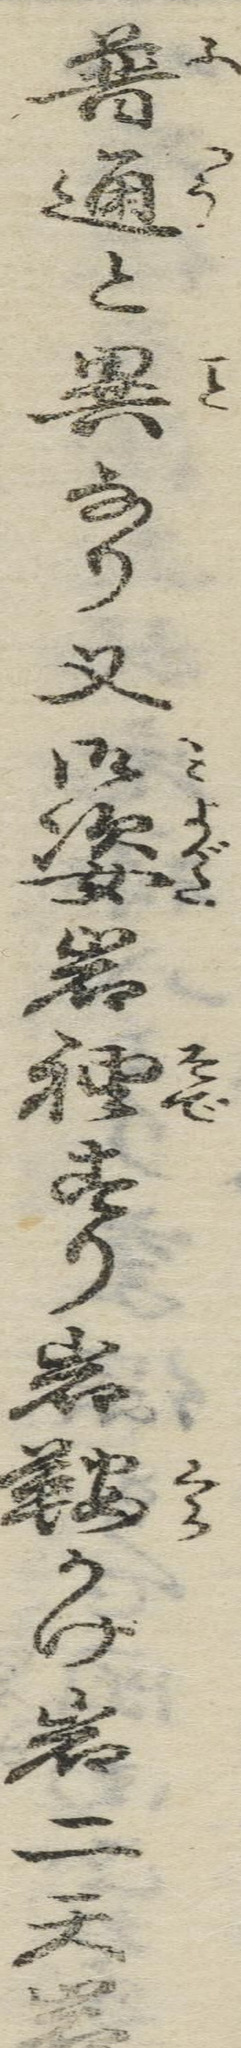普通と異なり又御姿岩袖すり岩鞍かけ岩二天岩
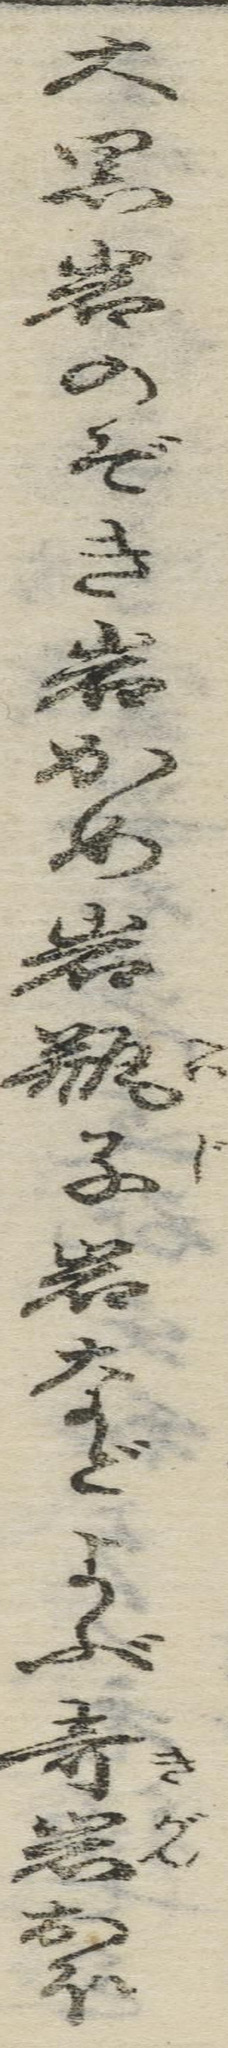大黒岩のぞき岩かめ岩瓶子岩などよぶ奇岩おほ
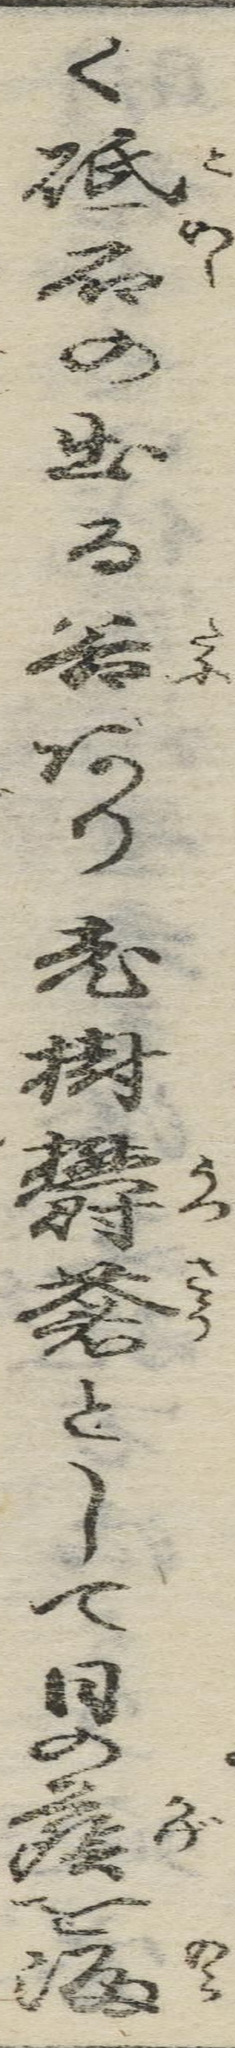く砥石の出る谷あり老樹鬱蒼として日の蔭を漏
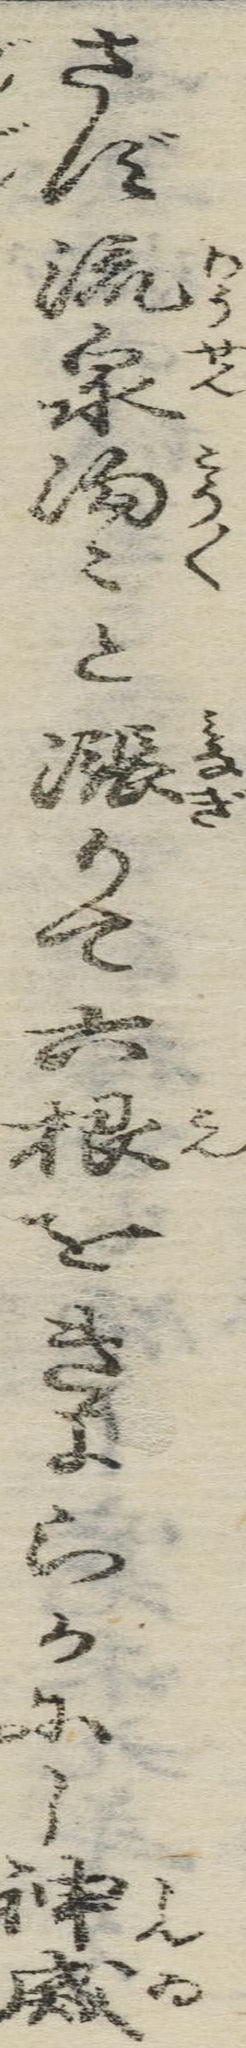さず流泉滔々と漲りて六根をきよらかにし神威
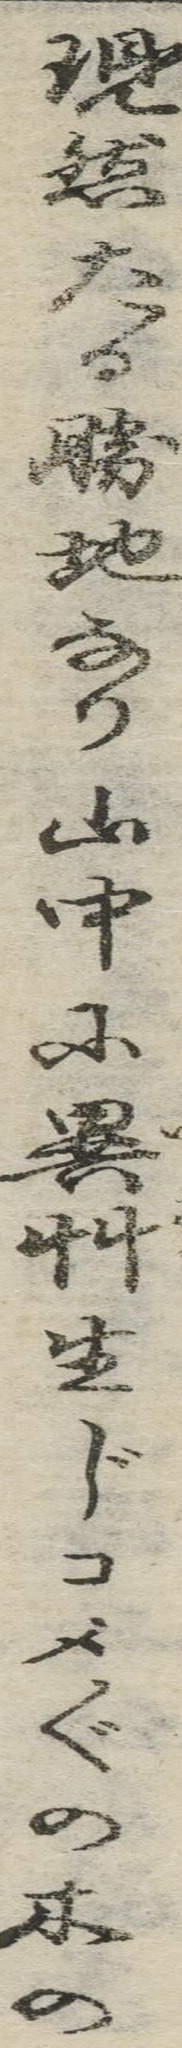現然たる勝地なり山中に異草生じコメ〴〵の木の
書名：上州伊香保鑛泉圖會　全
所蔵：東京大学地震研究所図書室 Earthquake Research Institute Library, The University of Tokyo, JAPAN
